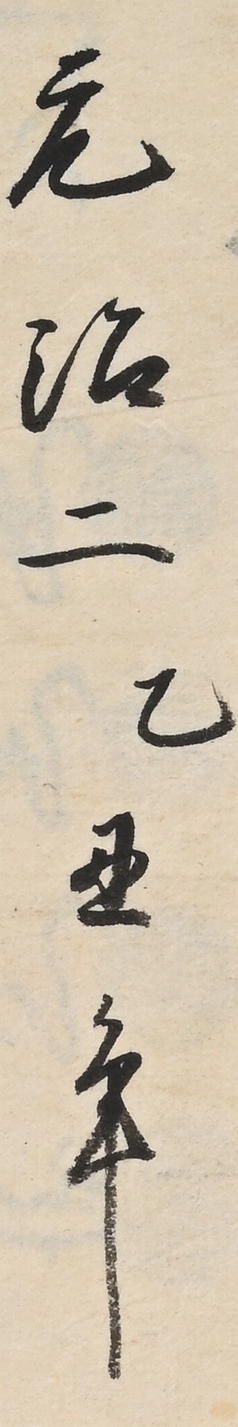元治二乙丑年
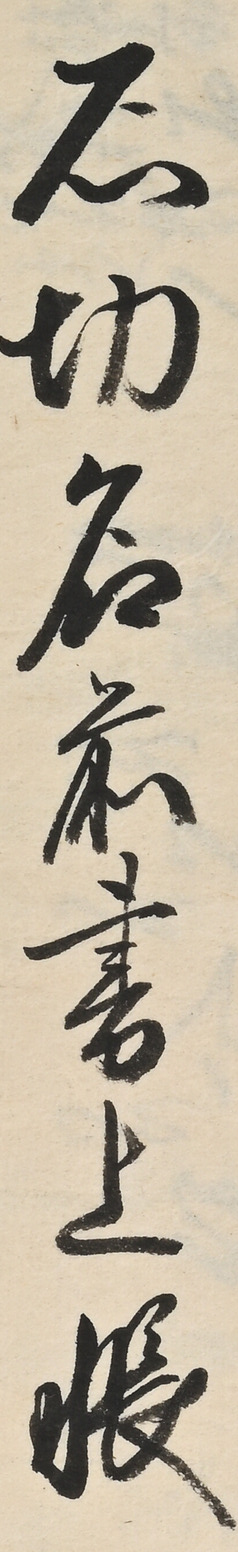石切名前書上帳
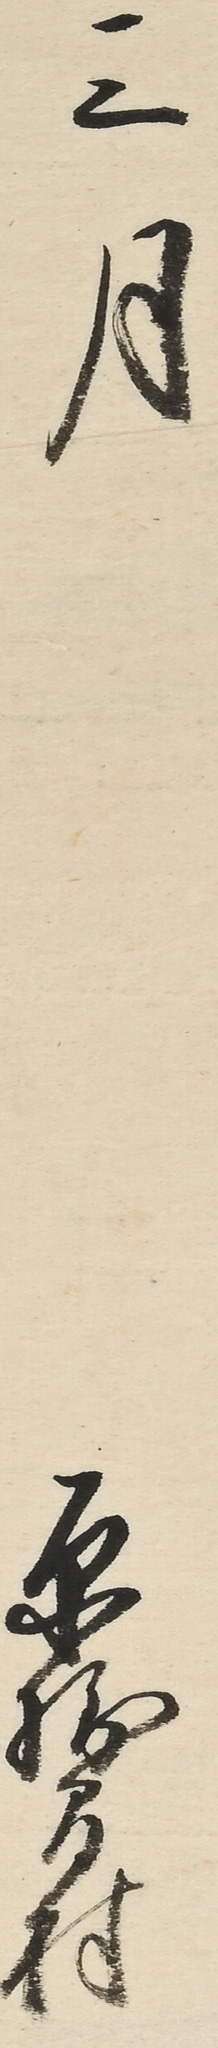三月原勝間村

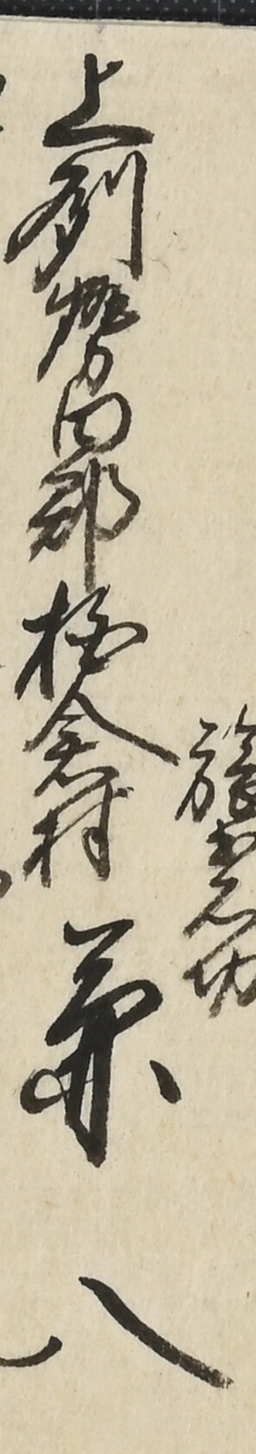上州勢田郡柏倉村兼八
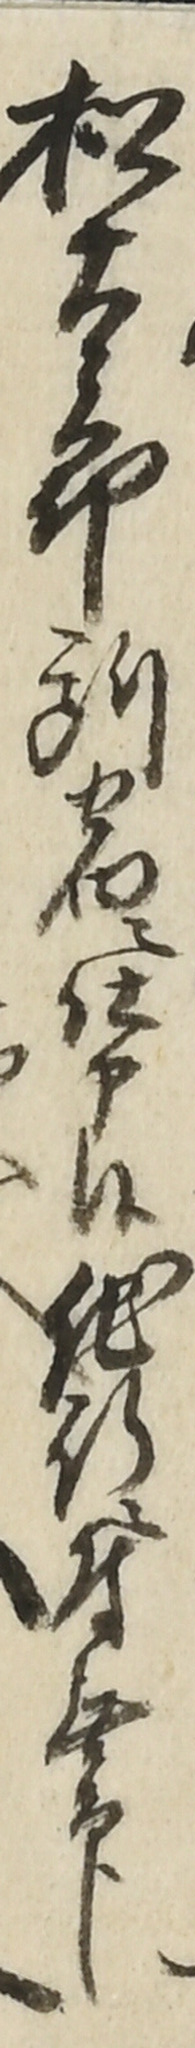松太郎所宿ニ仕申候他行ニ付無印

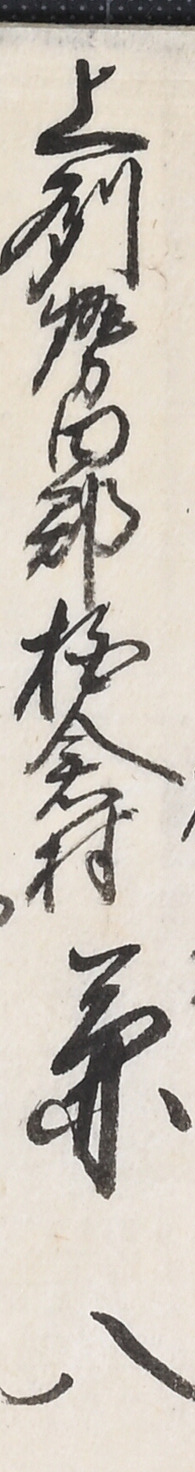上州勢田郡柏倉村兼八
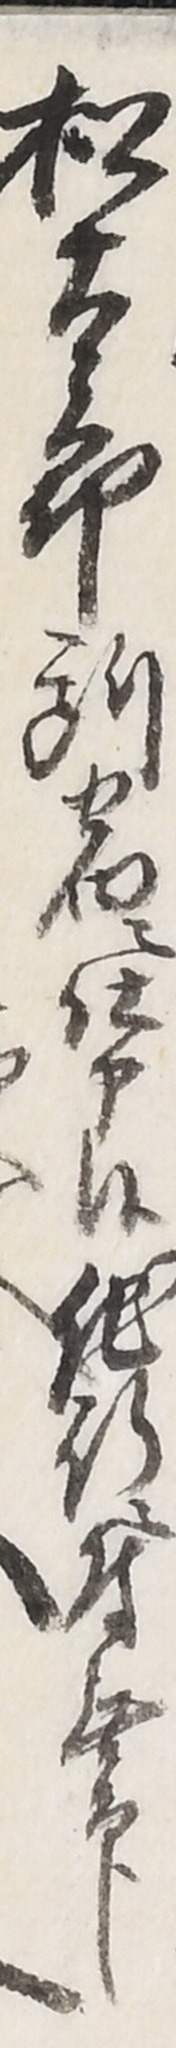松太郎所宿ニ仕申候他行ニ付無印

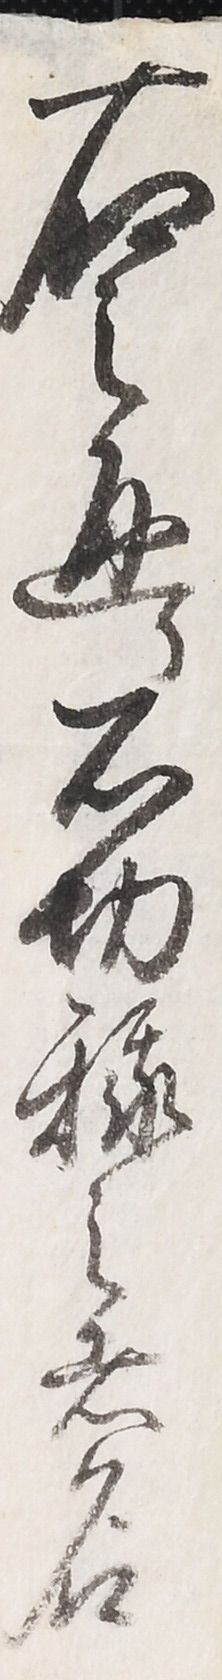右之通り石切稼之者名
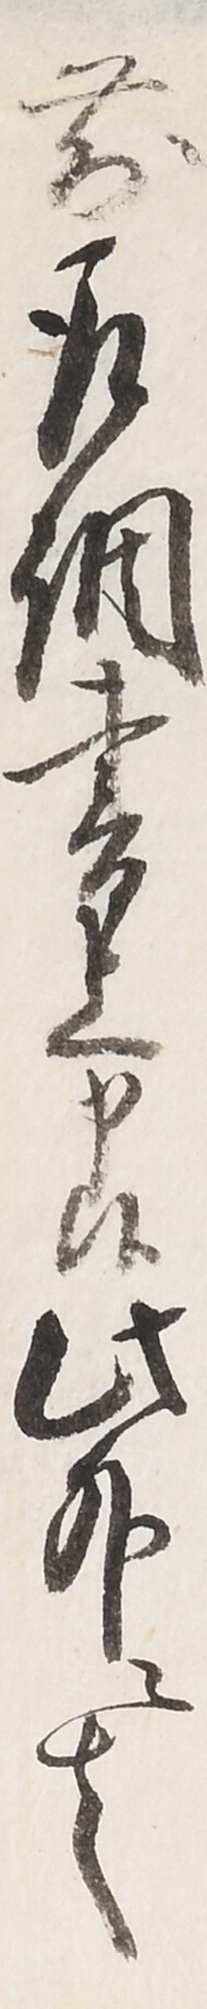前取調書上申候此外ニ者
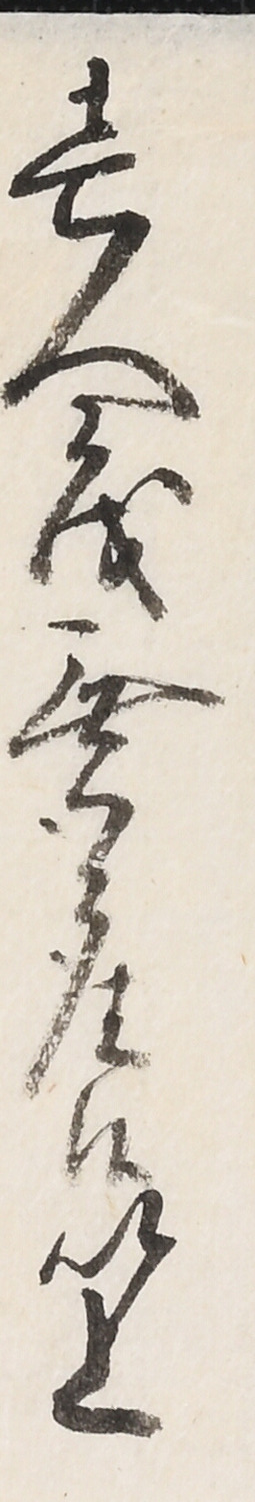壱人茂無御座候以上
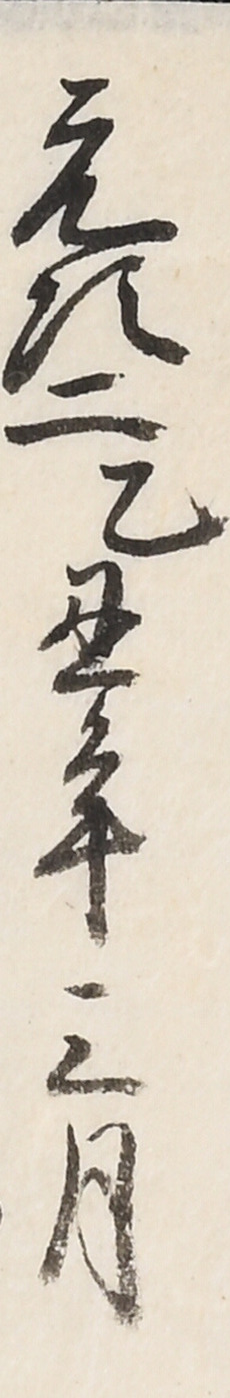元治乙丑年三月
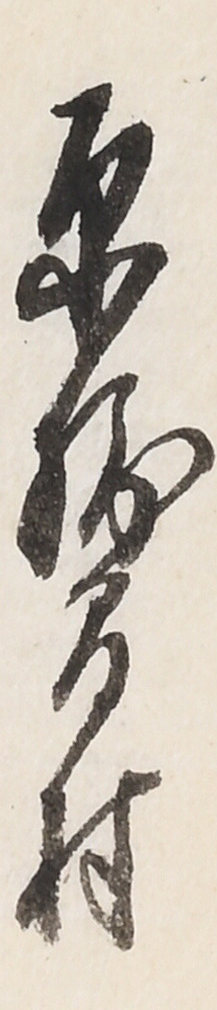原勝間村
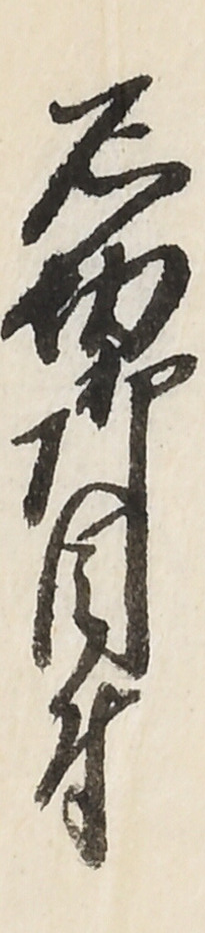石切御目付
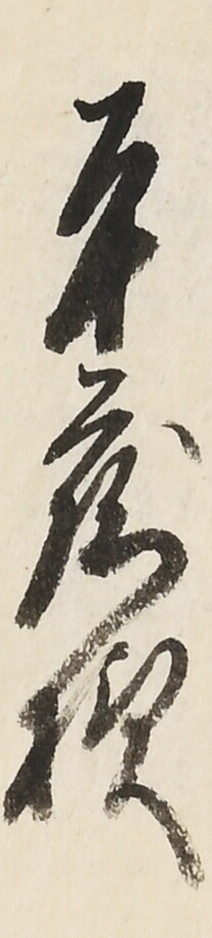平蔵様

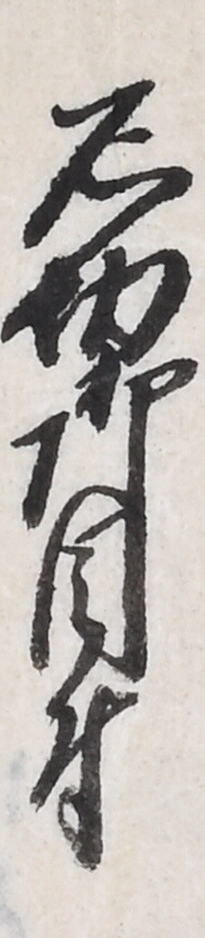石切御目付
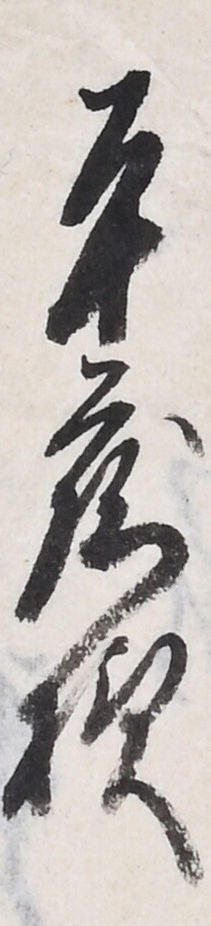平蔵様
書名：元治二乙丑年三月石切名前書上帳
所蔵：伊那市立高遠町図書館・合同会社AMANE
